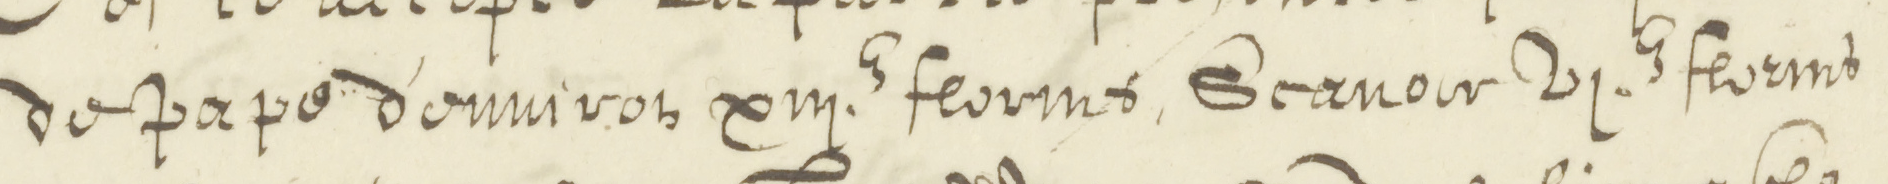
de pape d‛environ xiijm. florins, Scavoir vjm. florins
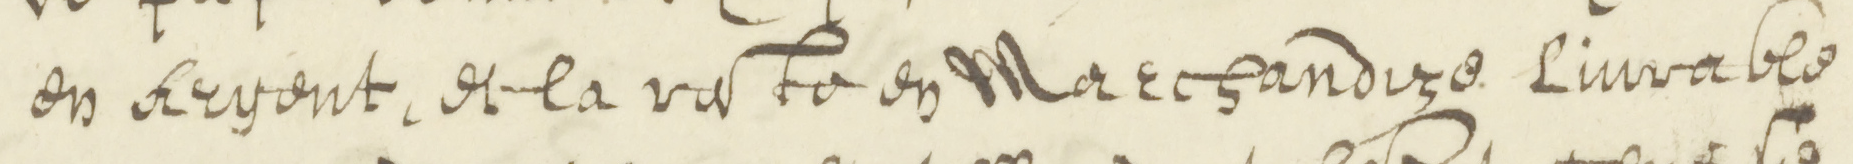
en argent, et la reste en Marchandize liurable
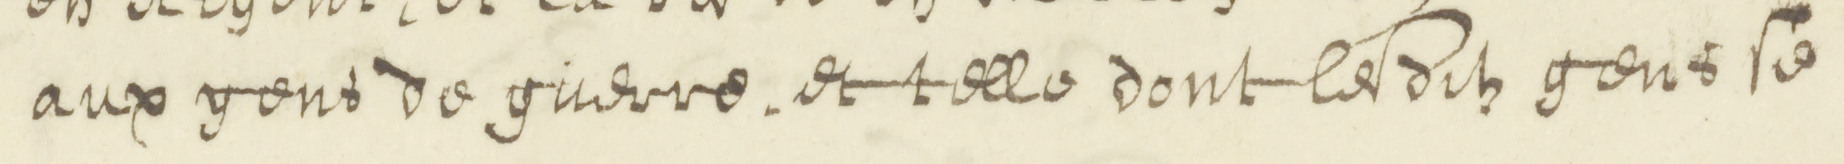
aux gens de guerre et telle dont lesditz gens se
